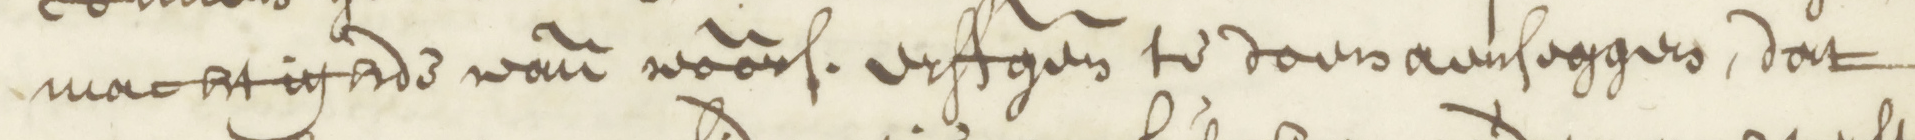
machtighde van voors. erffgen. te doen aenseggen, dat
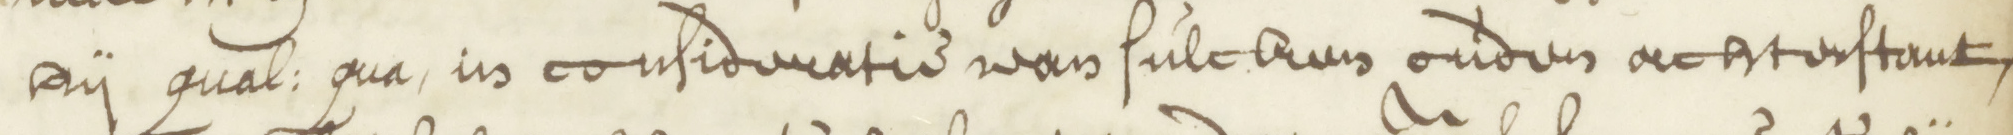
zij qual: qua in consideratie van sulcken ouden achterstant
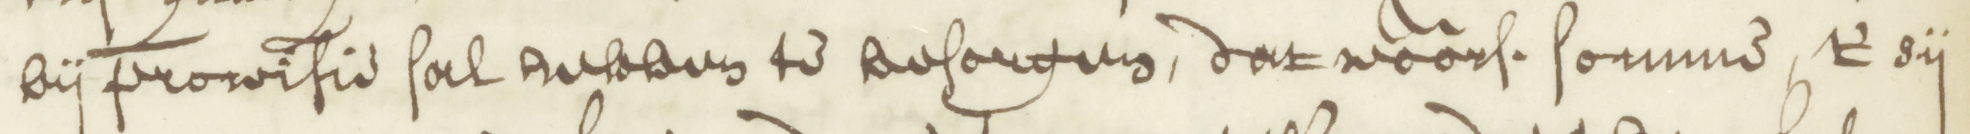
bij provisie sal hebben te besorgen, dat voors. somme t' sij
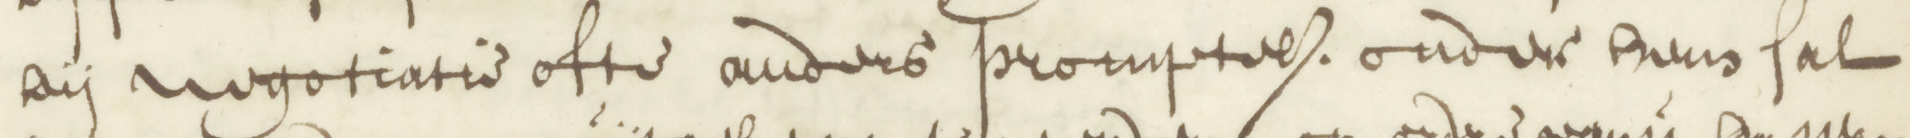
bij negotiatie ofte anders promptel. onder hem sal
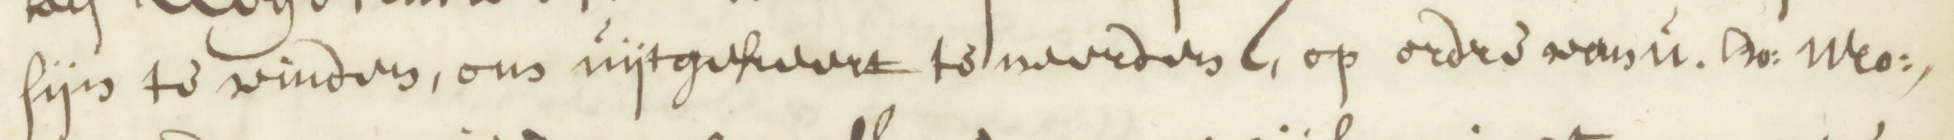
sijn te vinden, om uijtgekeert te werden, op ordre van u. Ho:Mo:
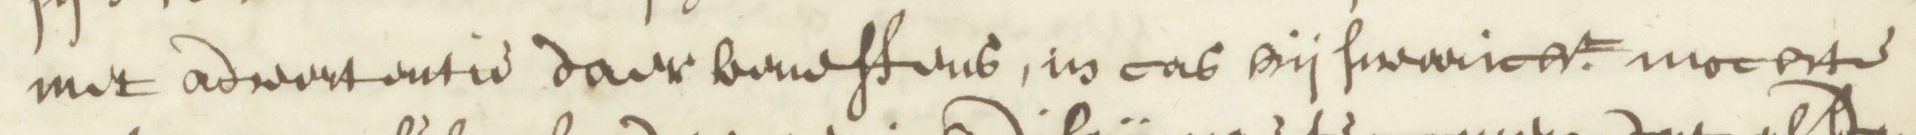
met advertentie daer beneffens, in cas hij swaricht. mochte
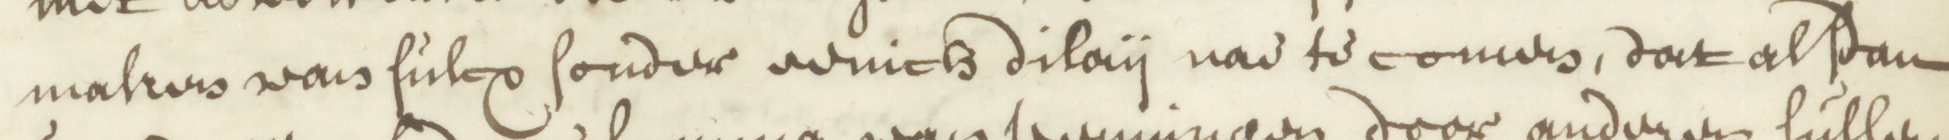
maken van sulcx sonder eenich dilaij nae te comen, dat alsdan
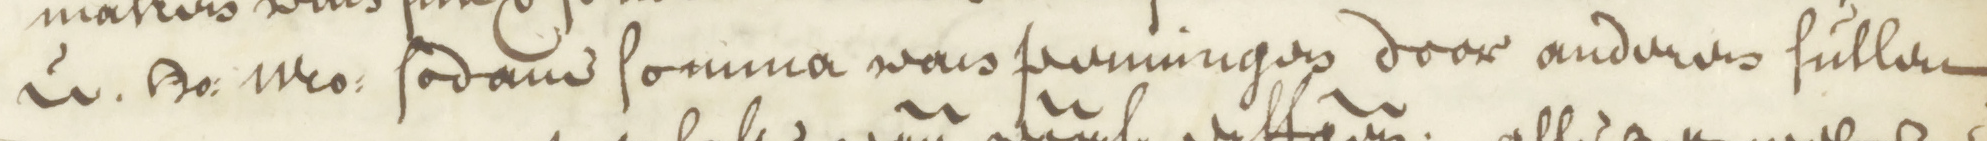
U. Ho:Mo: sodane somma van penningen door anderen sullen
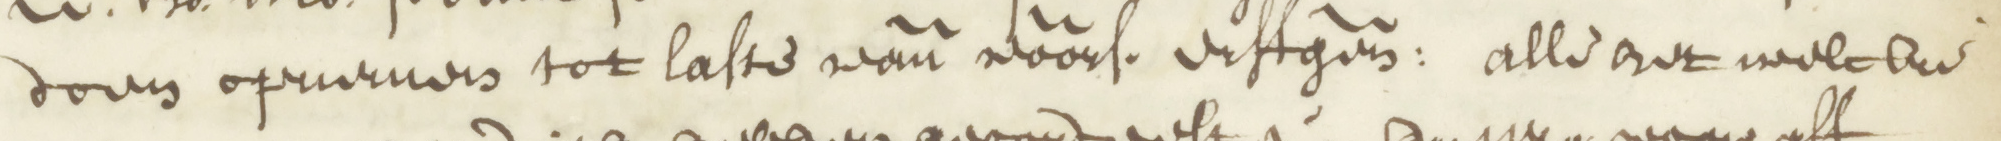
doen opnemen tot laste van voors. erffgen. alle het welcke
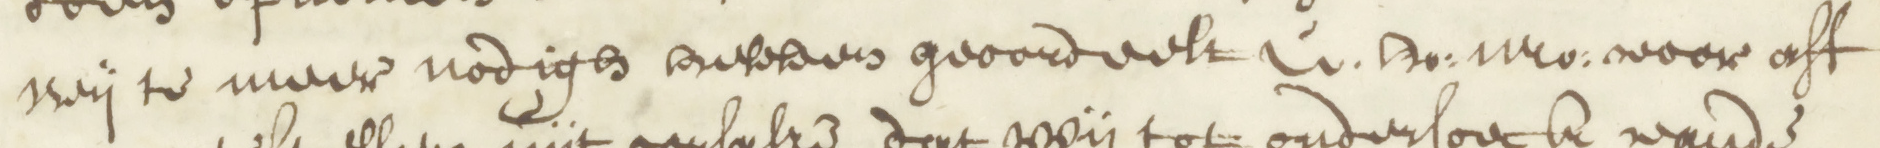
wij te meer nodigh hebben geoordeelt U. Ho:Mo: voor aff
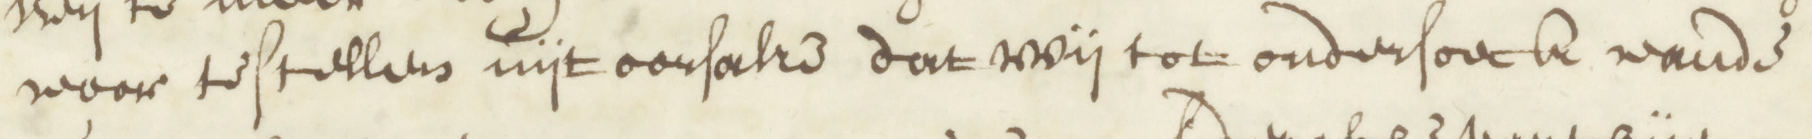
voor te stellen uijt oorsake dat wij tot ondersoeck van de
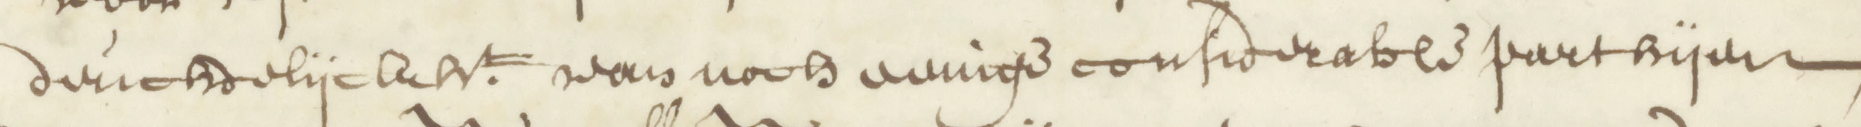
deuchdelijckht. van noch eenige considerable parthijen
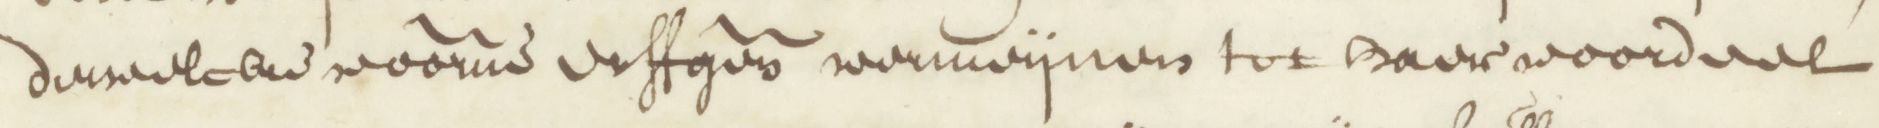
derwelkcen voorne. erffgen. vermeijnen tot haer voordeel
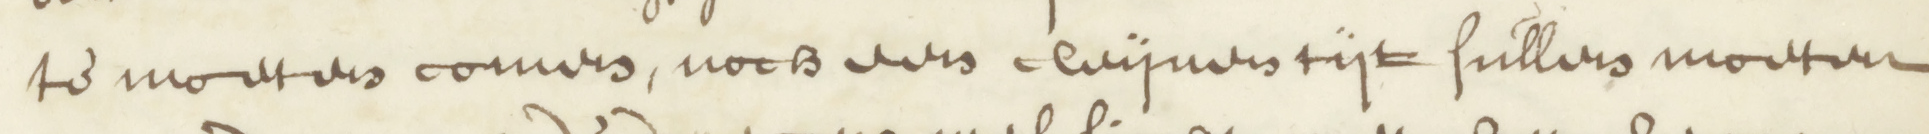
te moeten comen, noch een cleijnen tijt sullen moeten
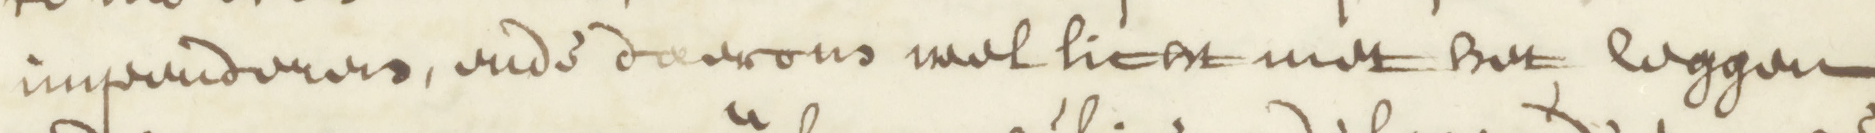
impenderen, ende daerom wellicht met het leggen
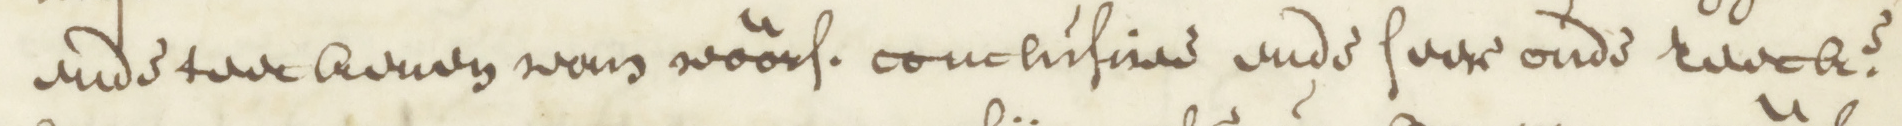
ende teeckenen van voors. conclusive ende seer oude reecke.
